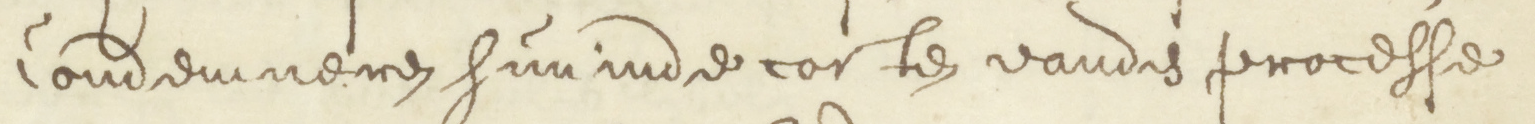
condemneren hun inde costen vanden processe
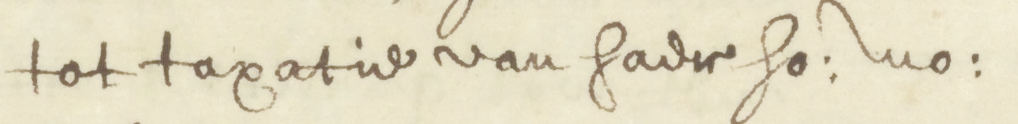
tot taxatie van haer Ho:Mo:
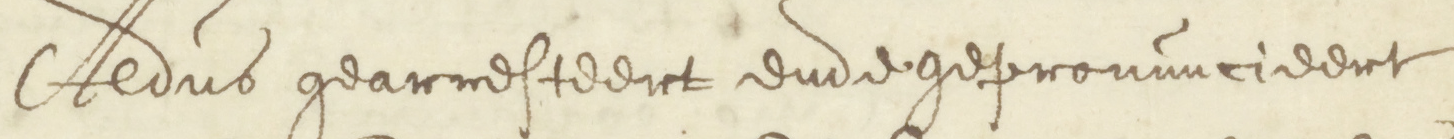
Aldus gearresteert, ende gepronuncieert
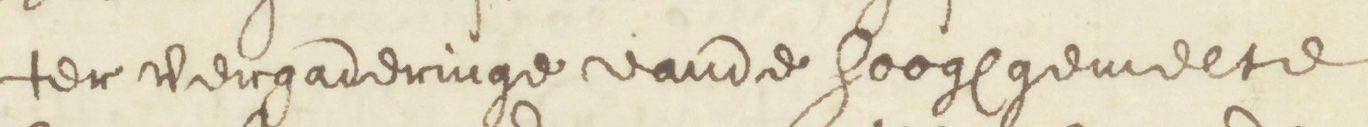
ter vergaderinge vande hooghgemelte
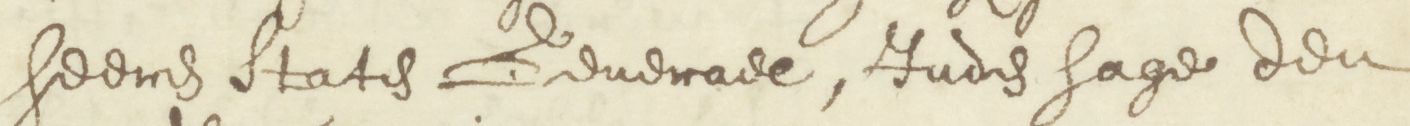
heeren staten Generael, inden Hage den
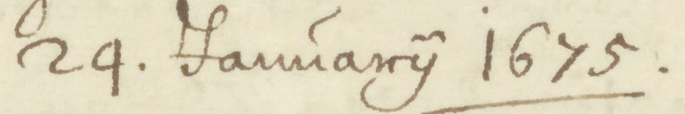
29. Januarij 1675.
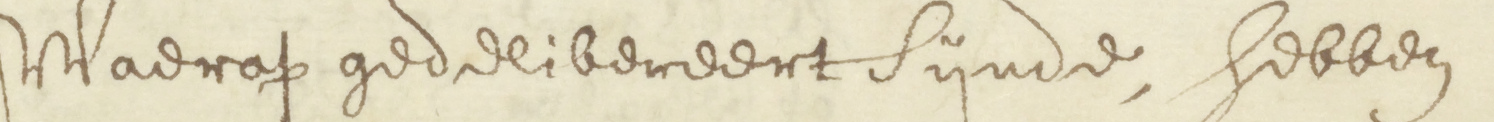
Waerop gedelibereert sijnde, hebben
